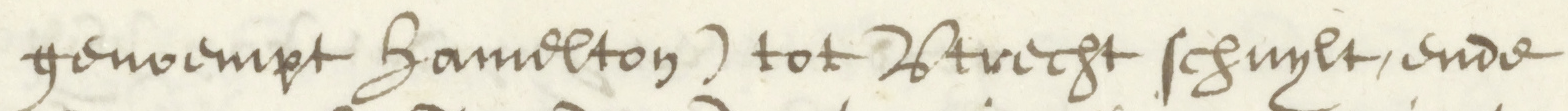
genoempt Hamelton) tot Utrecht schuylt, ende
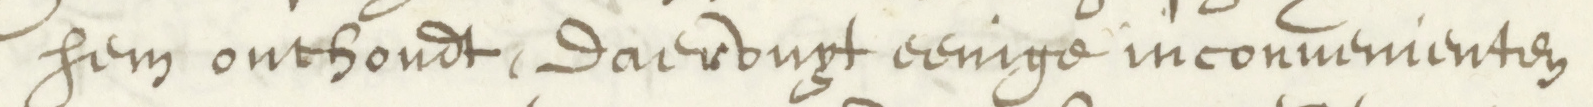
hem onthoudt, daervuyt eenige inconvenienten
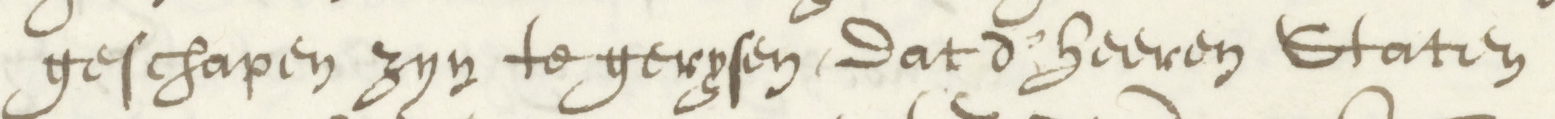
geschapen zijn te gerysen, dat d'heeren Staten
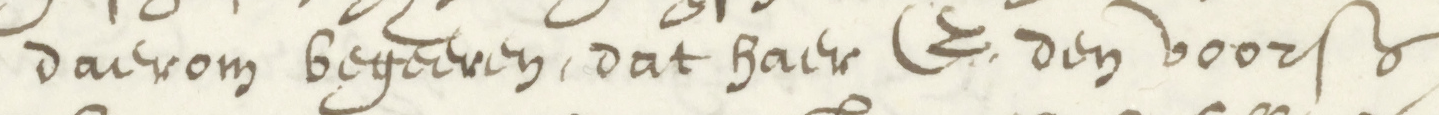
daerom begeeren, dat haer E. den voors
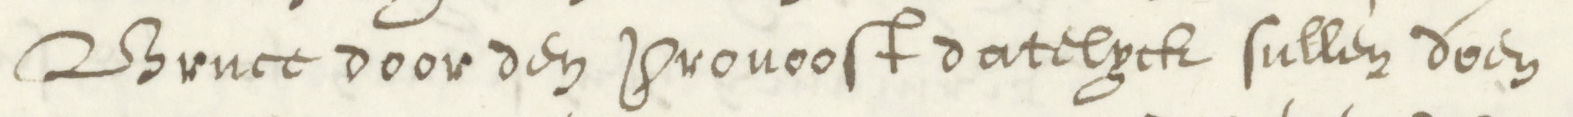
Bruce door den prouoost datelyck sullen doen
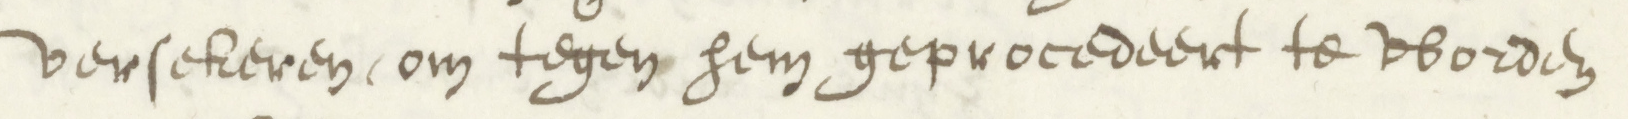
versekeren, om tegen hem geprocedeert te worden
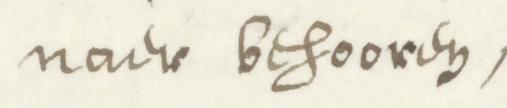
naer behooren.
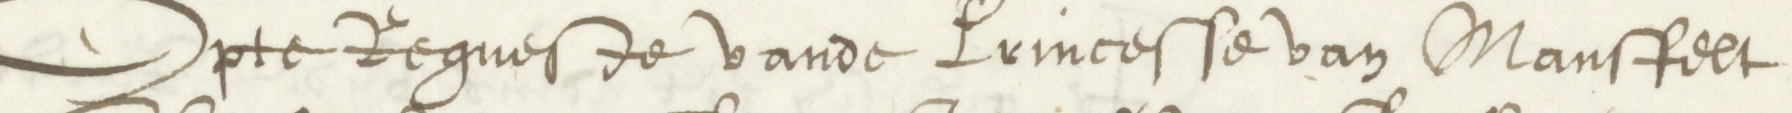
Opte requeste vande Princesse van Mansfelt
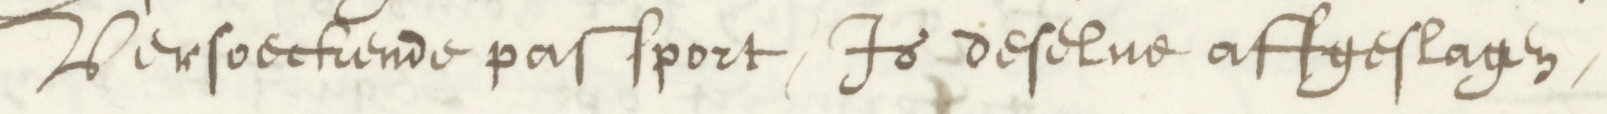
versoeckende passport is deselve affgeslagen.
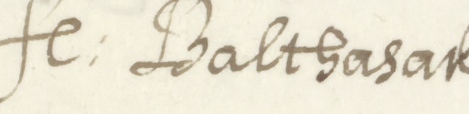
Fl. Balthasar
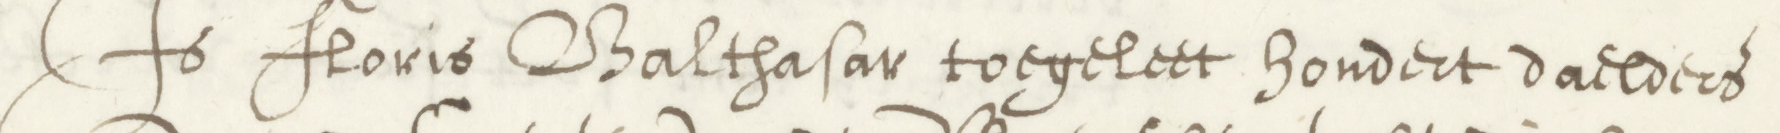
Is Floris Balthasar toegeleet hondert daelders
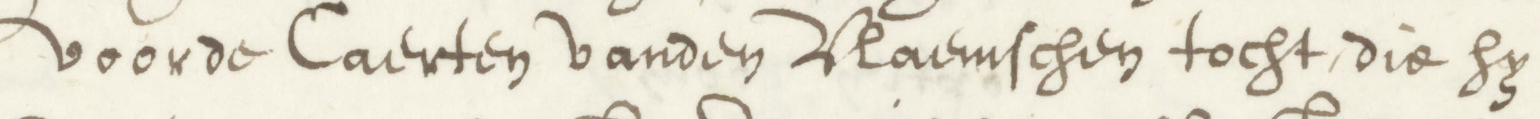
voorde Caerten vanden Vlaemschen tocht, die hy
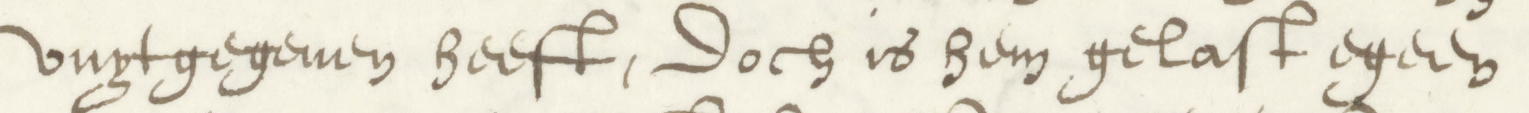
vuytgegeven heeft, doch is hem gelast egeen
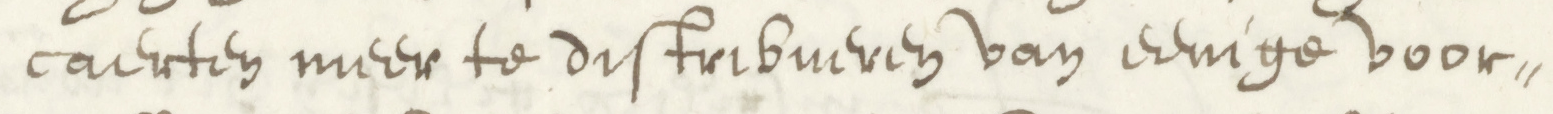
caerten meer te distribueren van eenige voor„
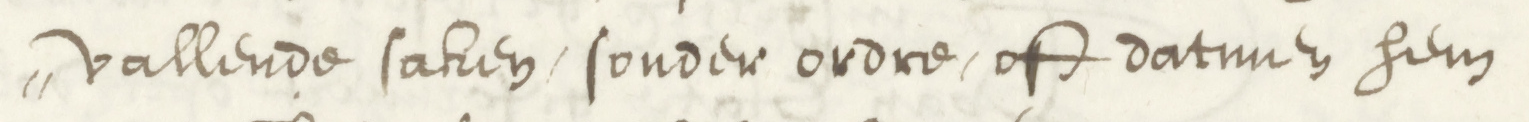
,,vallende saken, sonder ordre off datmen hem
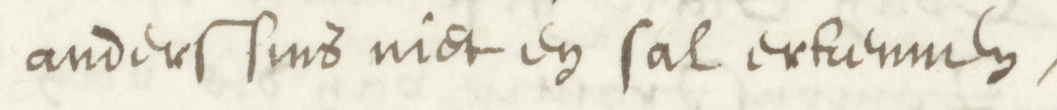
anderssins niet op sal erkennen.
